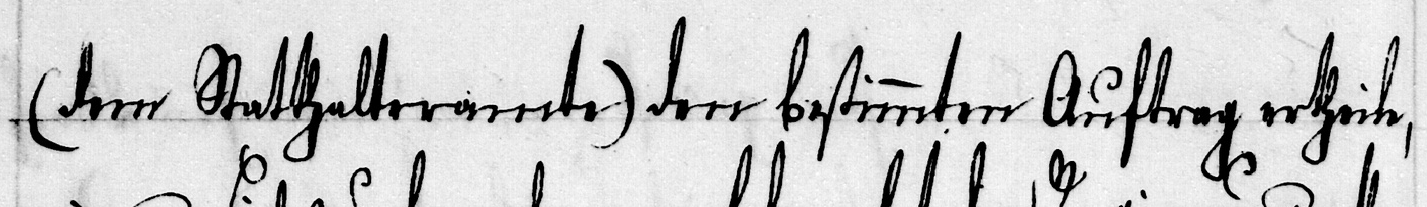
(dem Statthalteramte) den bestimmten Auftrag ertheil¬
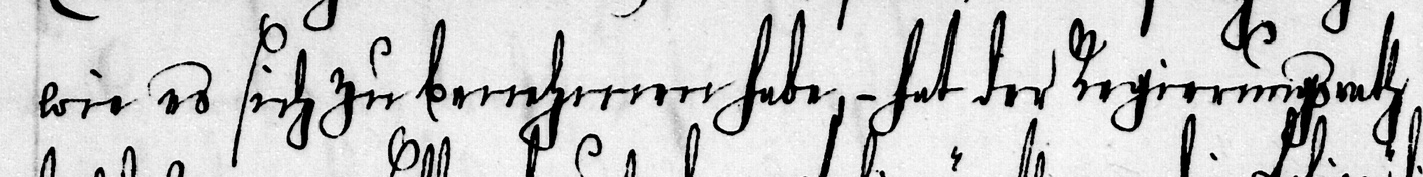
wie es sich zu benehmen habe, – hat der Regierungsrath
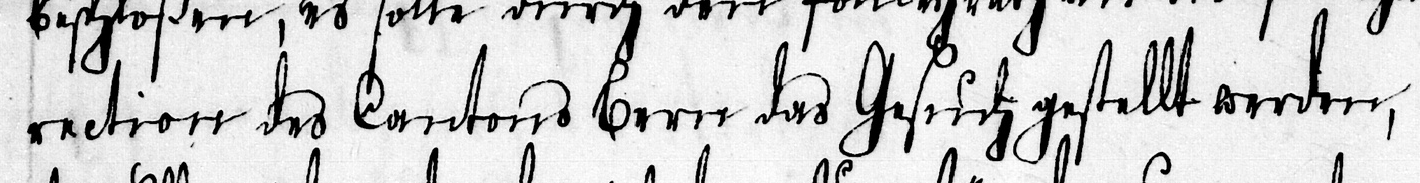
rection des Cantons Bern das Gesuch gestellt werden,
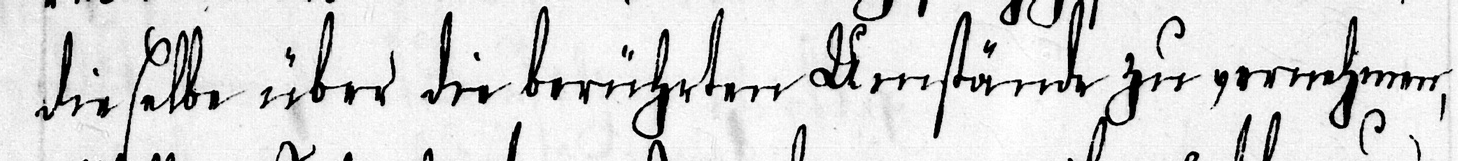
dieselbe über die berührten Umstände zu vernehmen,
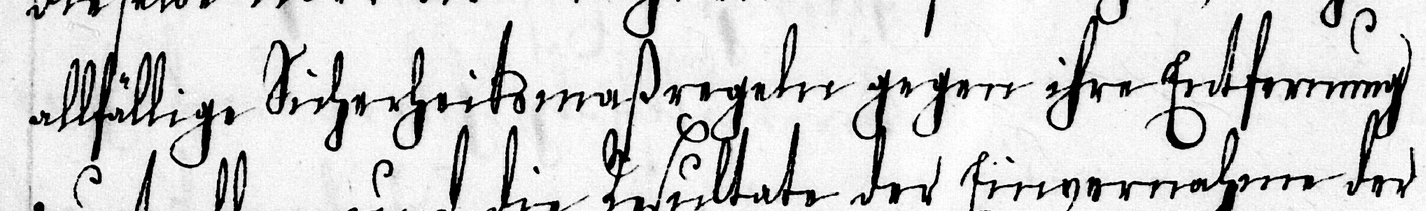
allfällige Sicherheitsmaßregeln gegen ihre Entfernung
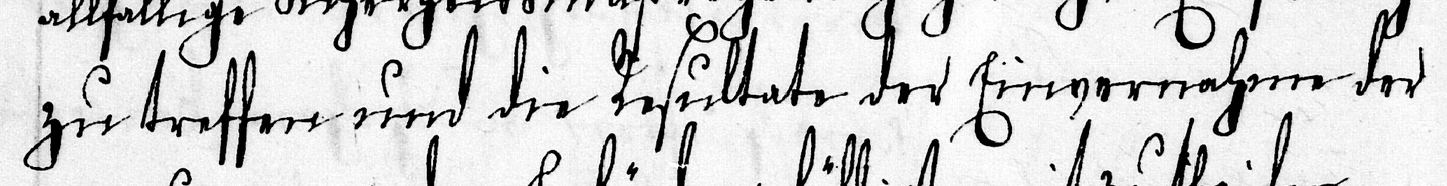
zu treffen und die Resultate der Einvernahme der
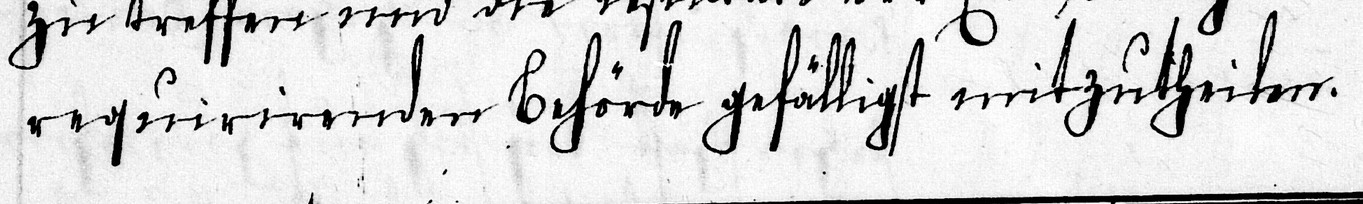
requirirenden Behörde gefälligst mitzutheilen.
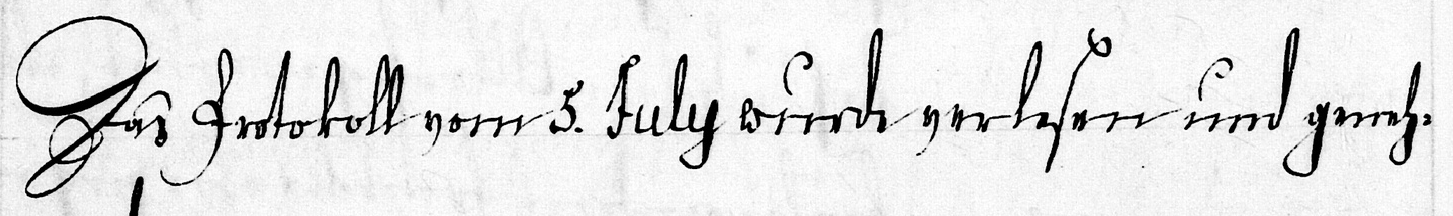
Das Protokoll vom 5. July wurde verlesen und geneh¬
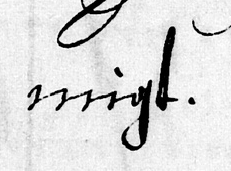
migt.
